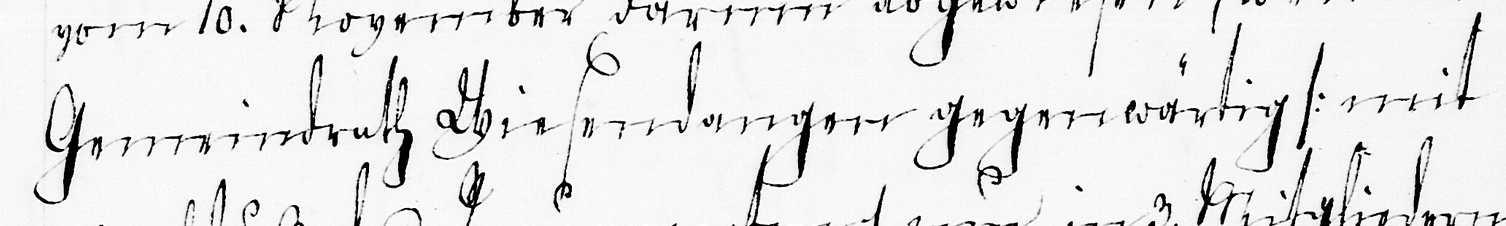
Gemeindrath Wiesendangen gegenwärtig [mit
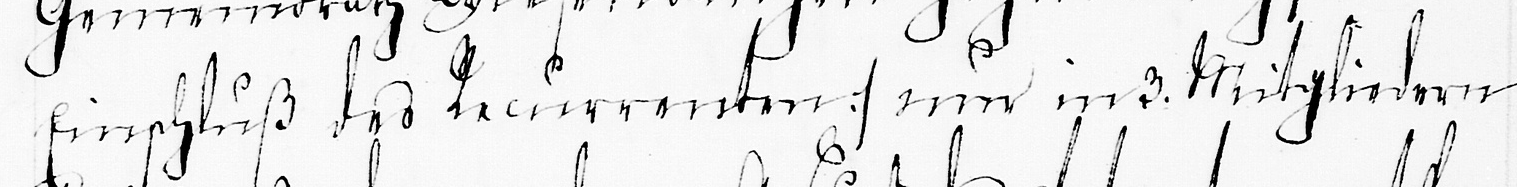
Einschluß des Recurrenten] nur in 3. Mitgliedern
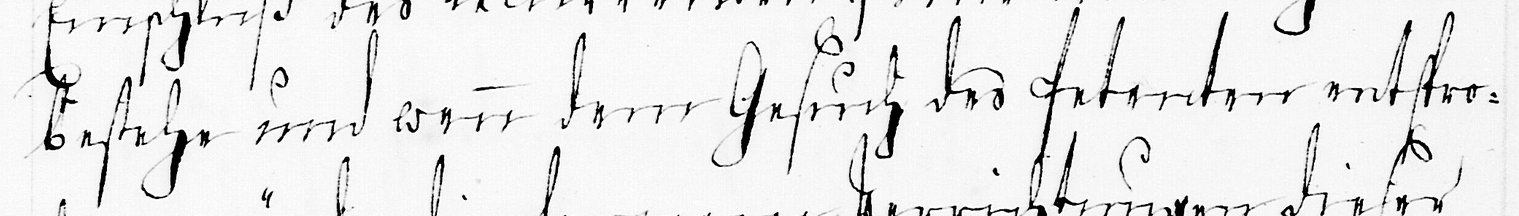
bestehe und wenn dem Gesuch des Petenten entspro¬
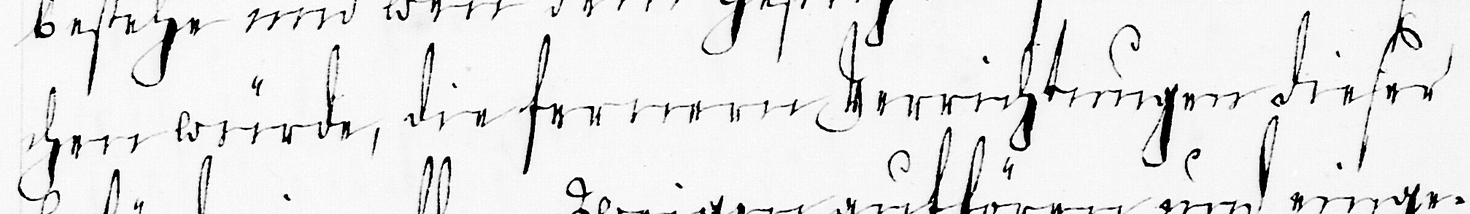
chen würde, die fernern Verrichtungen dieser
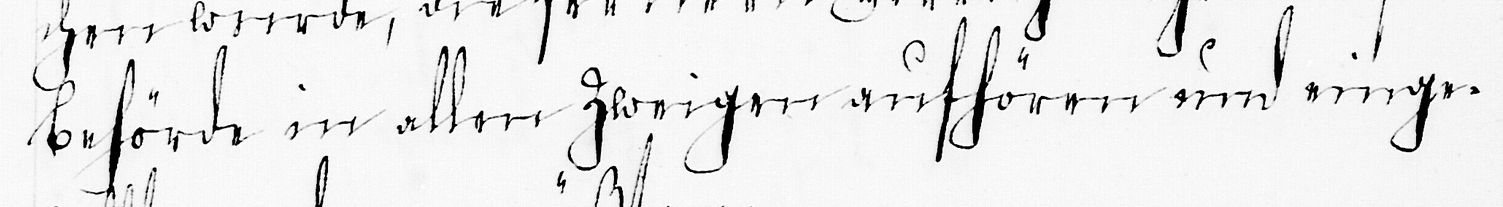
Behörde in allen Zweigen aufhören und einge¬
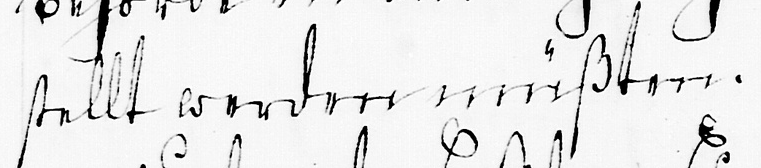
stellt werden müßten.
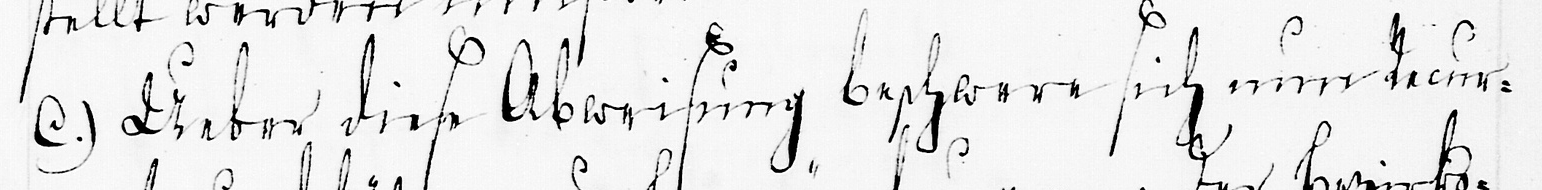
C.) Ueber diese Abweisung beschwere sich nun Recur¬
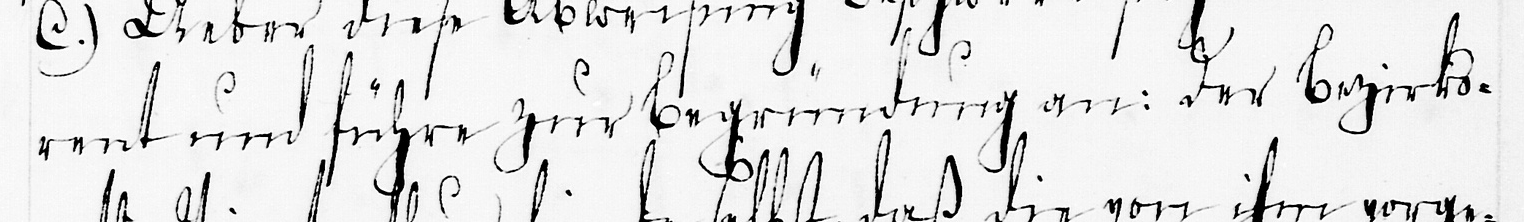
rent und führe zur Begründung an: Der Bezirks¬
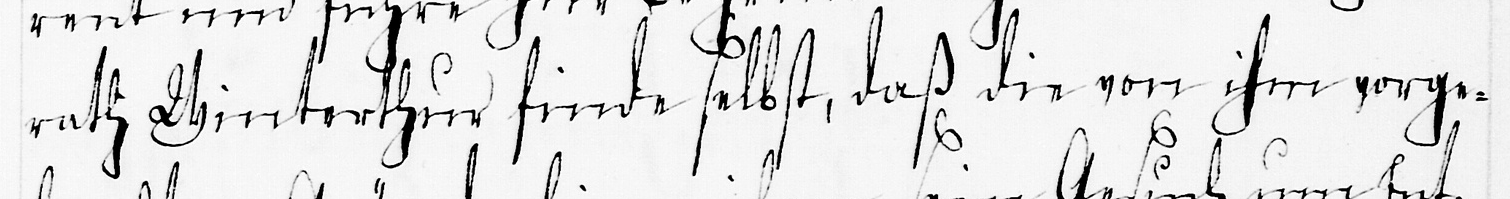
rath Winterthur finde selbst, daß die von ihm vorge¬
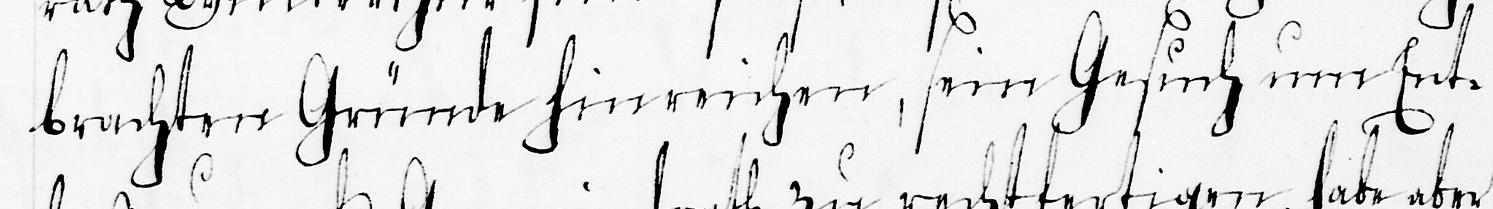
brachten Gründe hinreichen, sein Gesuch um Ent¬
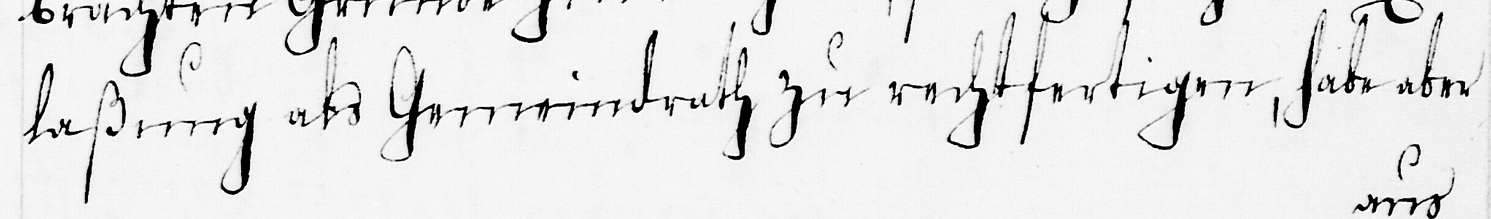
laßung als Gemeindrath zu rechtfertigen, habe aber
